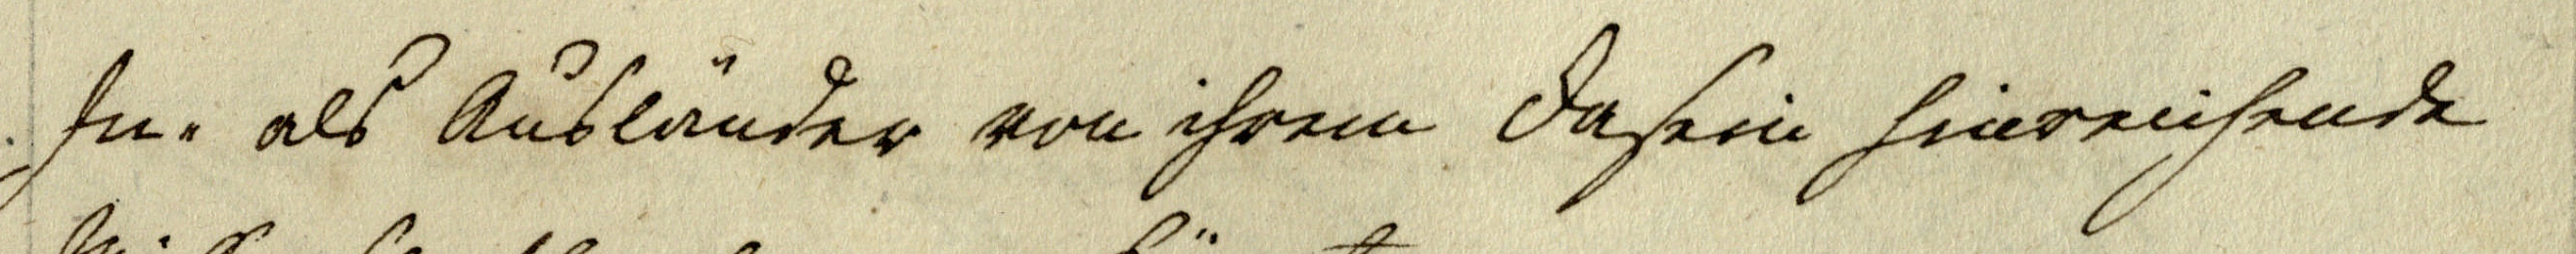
In- als Ausländer von ihrem Dasein hinreichende
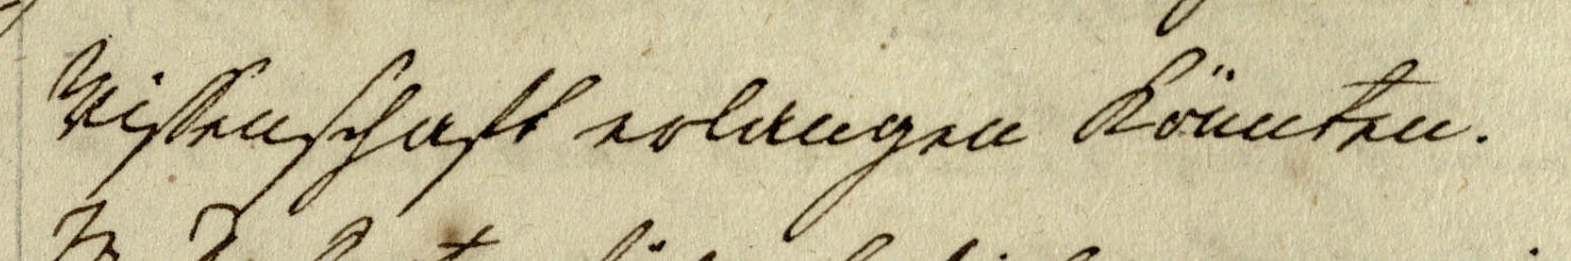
Wissenschaft erlangen könnten.
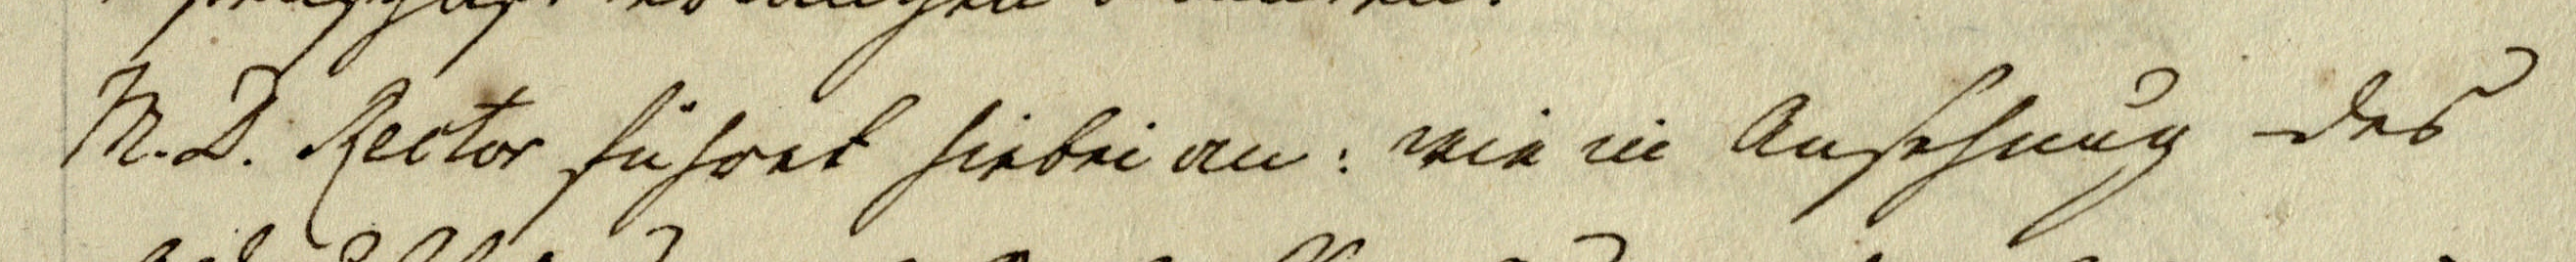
M. D. Rector führet hiebei an: wie in Ansehung des
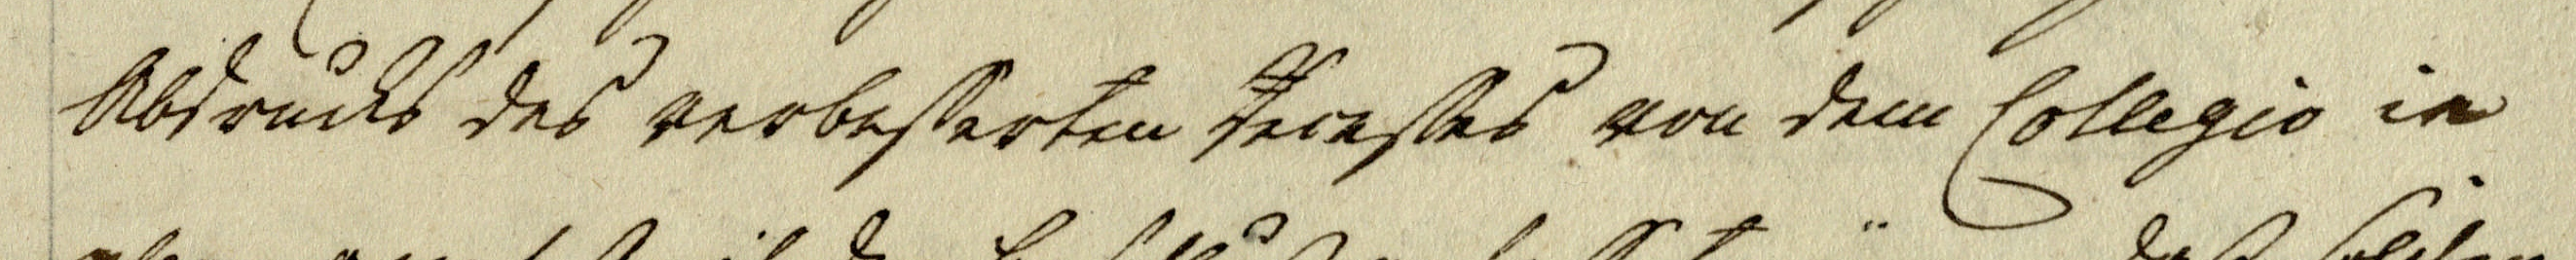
Abdrucks des verbesserten Recesses von dem Collegio in
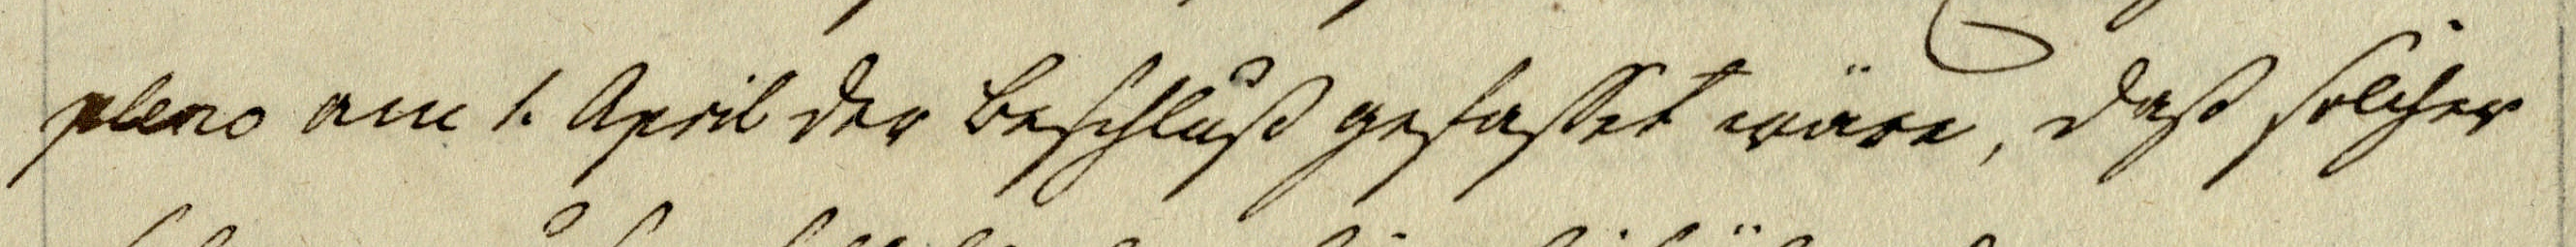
pleno am 1. April der Beschluß gefasset wäre, daß solcher
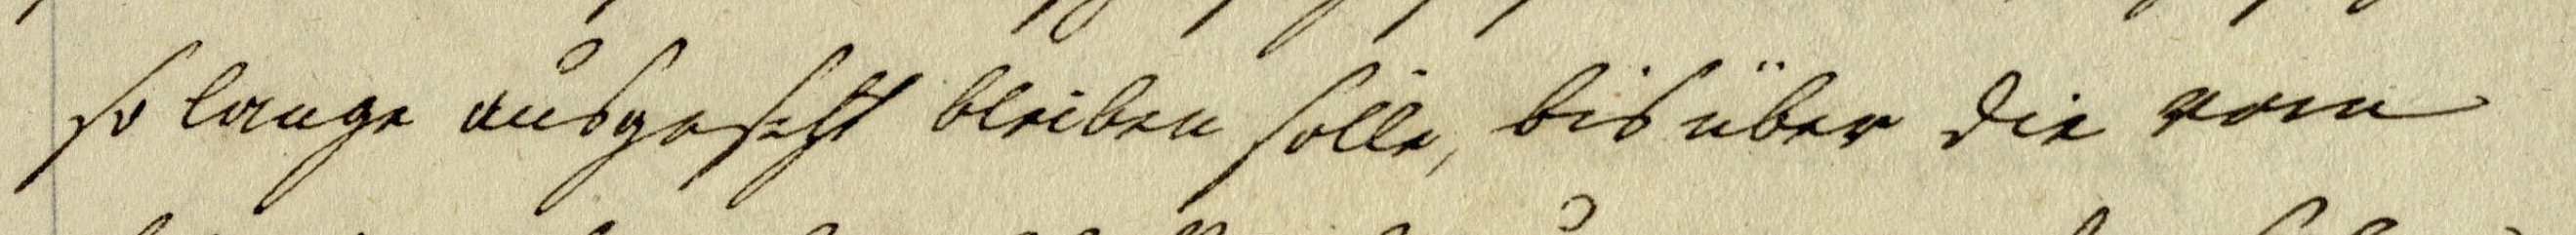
so lange ausgesetzt bleiben solle, bis über die vom
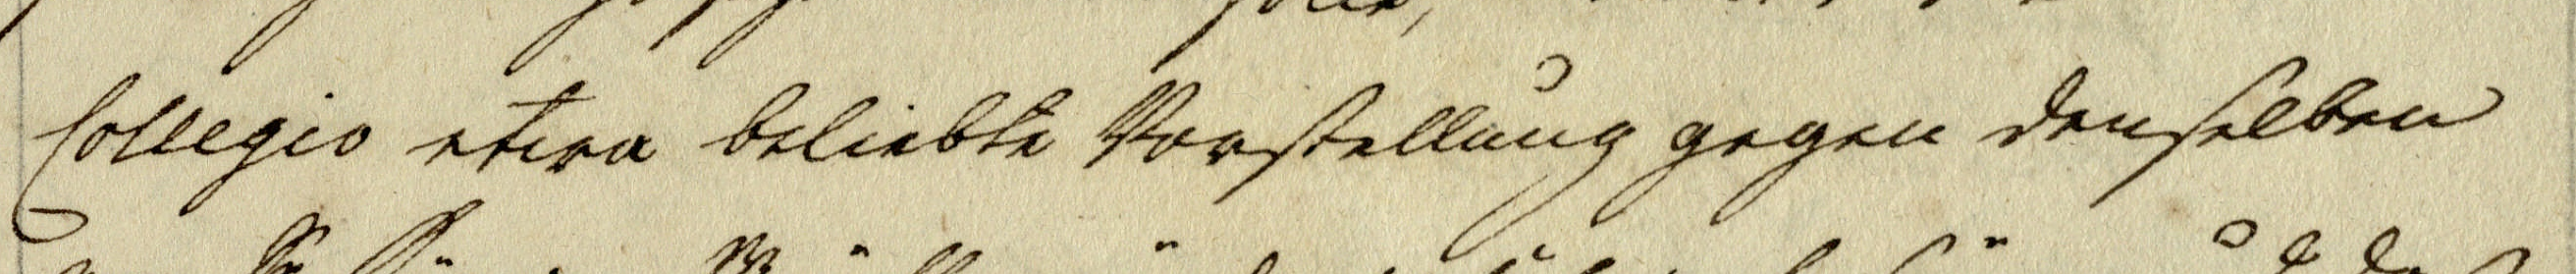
Collegio etwa beliebte Vorstellung gegen denselben
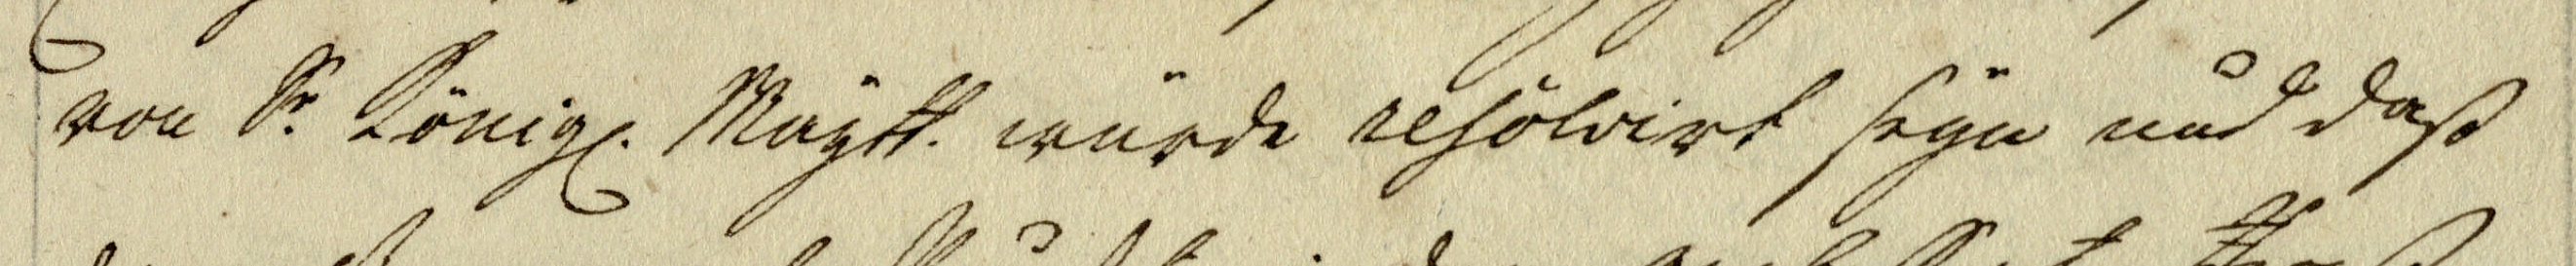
von Sr Königl. Maÿtt. würde resolvirt seÿn und daß
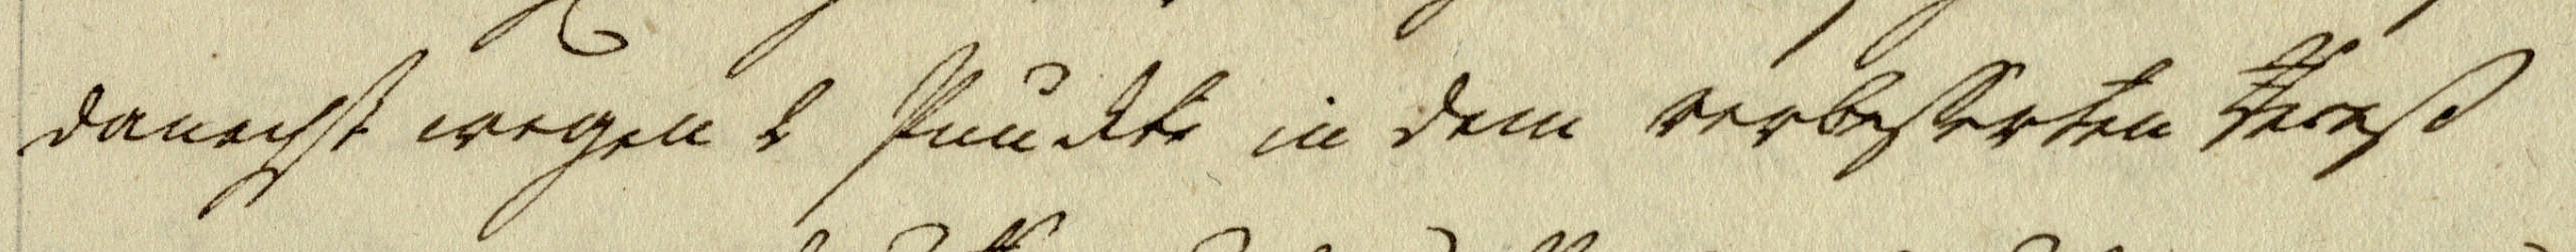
danechst wegen 2 Punkte in dem verbesserten Receß
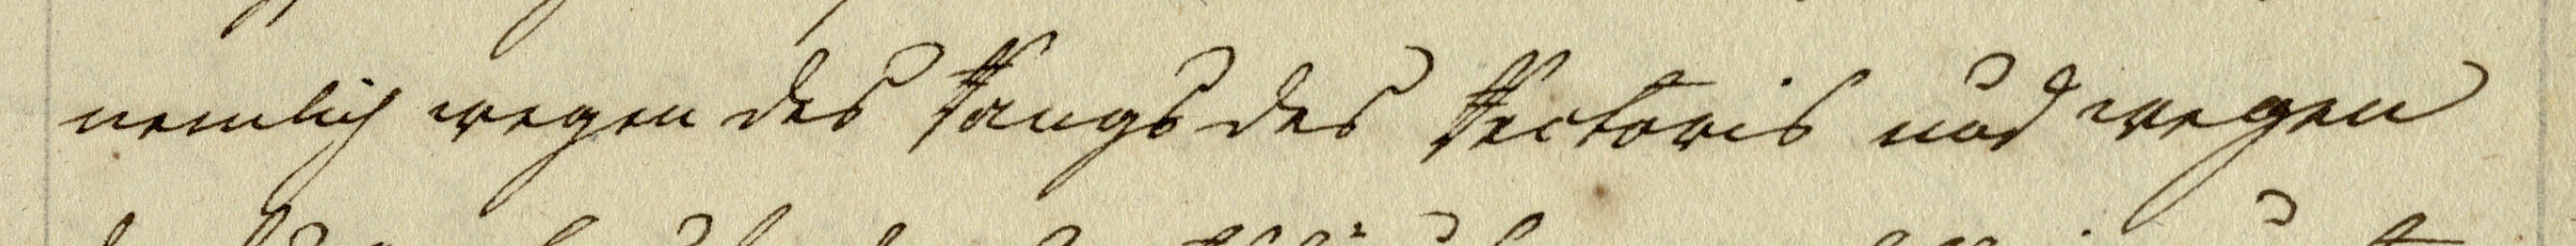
nemlich wegen des Rangs des Rectoris und wegen
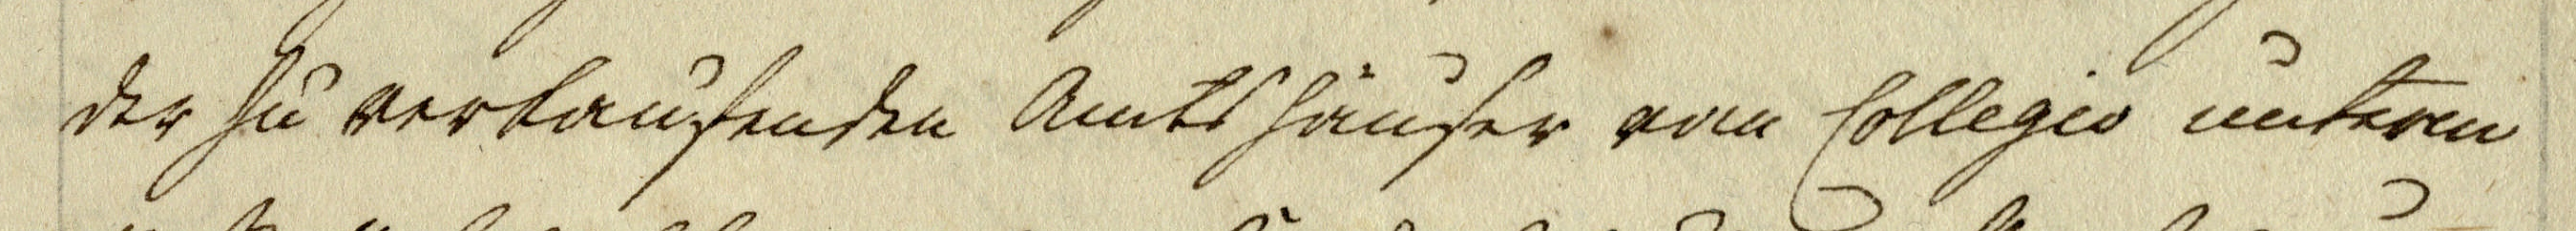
der zu verkaufenden Amts Häuser vom Collegio unterm
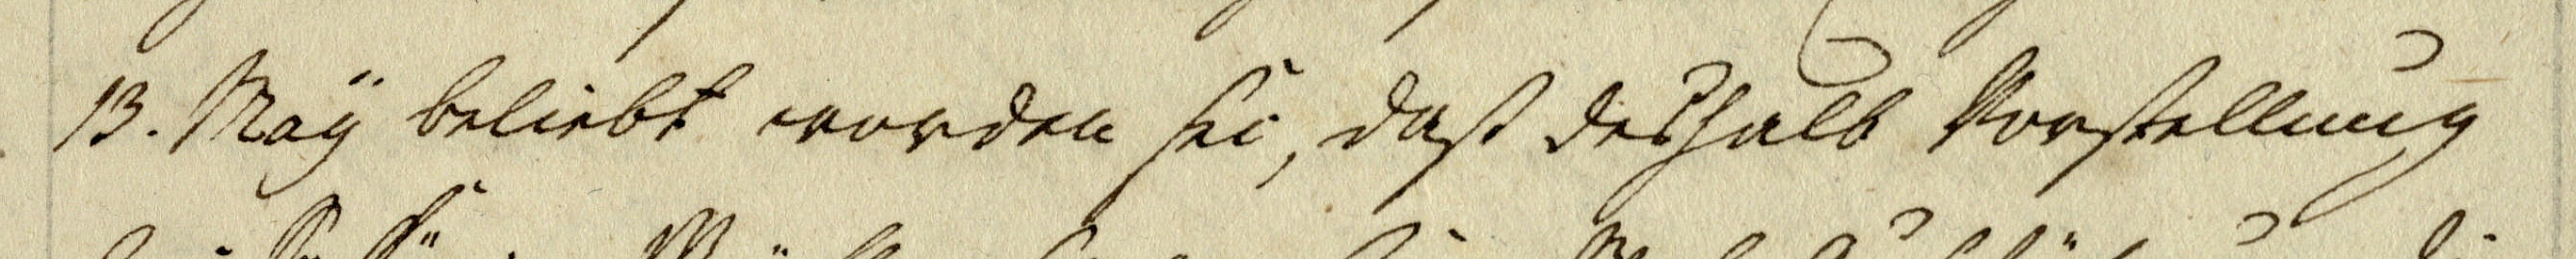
13. Maÿ beliebt worden sei, daß deshalb Vorstellung
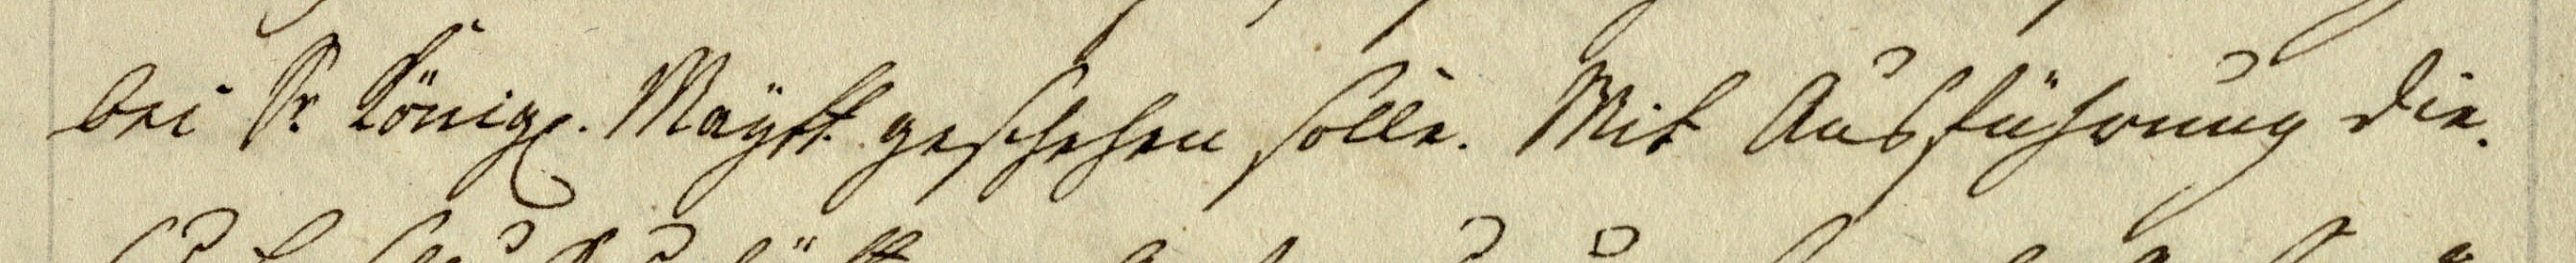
bei Sr Königl. Maÿtt. geschehen solle. Mit Ausführung die¬
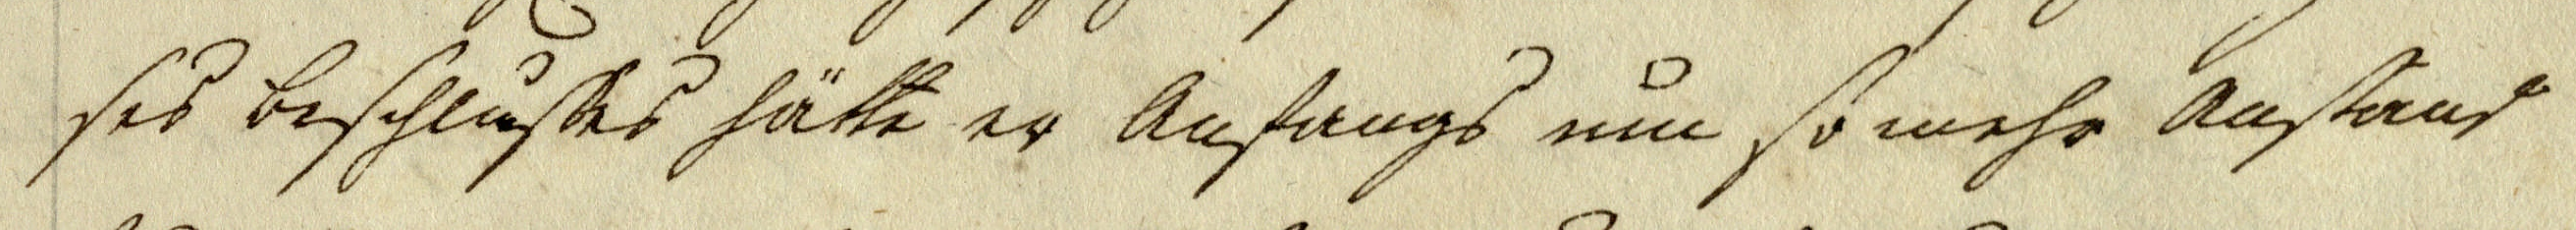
ses Beschlusses hätte er Anfangs um so mehr Anstand
